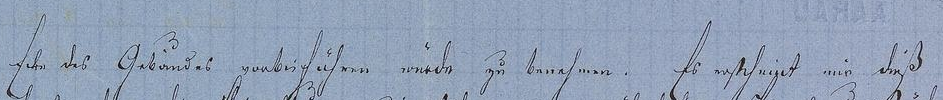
Ecke des Gebäudes vorbeiführen würde zu benehmen. Es erscheint mir dieß
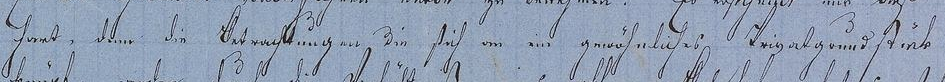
hart, denn die Betrachtungen die sich an ein gewöhnliches Privatgrundstück
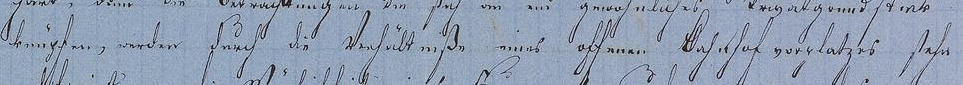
knüpfen, werden durch die Verhältniße eines offenen Bahnhofvorplatzes sehr
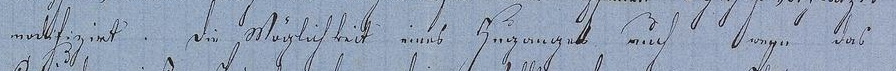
modifizirt. Die Möglichkeit eines Zuganges auch wenn das
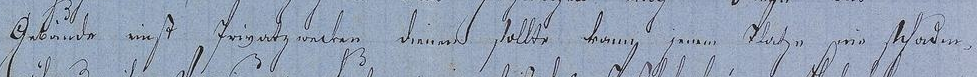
Gebäude einst Privatzwecken dienen sollte kann jenem Platze nie schaden,
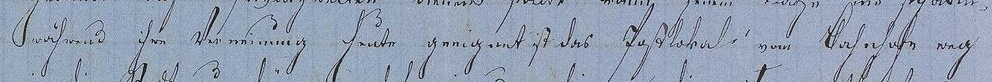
während ihre Verneinung heute geeignet ist das Postlokal vom Bahnhofe weg
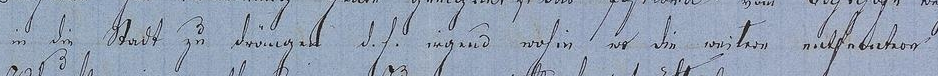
in die Stadt zu drängen d. h. irgend wohin wo die weitere entferntere
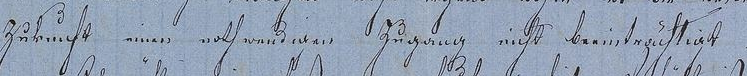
Zukunft einen nothwendigen Zugang nicht beeinträchtigt.
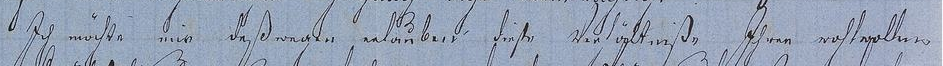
Ich möchte mir deßwegen erlauben diese Verhältniße Ihrer wohlwollen-
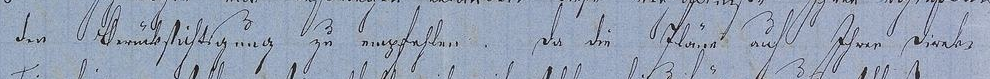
den Berücksichtigung zu empfehlen. Da die Pläne auf Ihrer Direk-
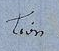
tion
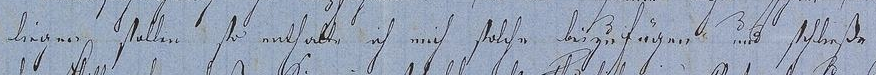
liegen sollen so enthalte ich mich solche beizufügen und schließe
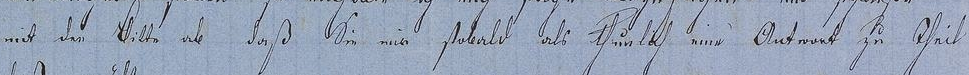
mit der Bitte ab daß Sie mir sobald als thunlich eine Antwort zu Theil
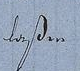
laßen
